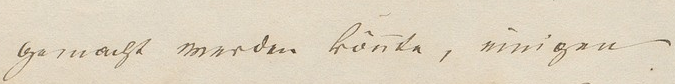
gemacht werden könnte, einigen
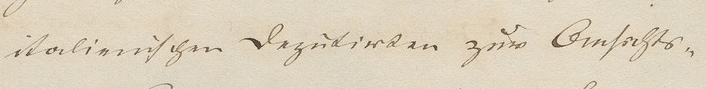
italienischen Deputirten zur Ansichts-
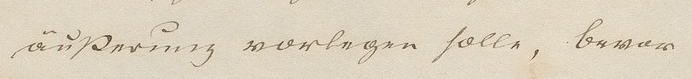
äußerung vorlegen solle, bevor
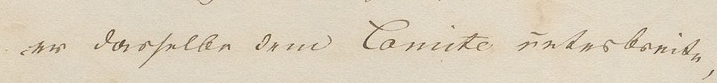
er dasselbe dem Comite unterbreite,
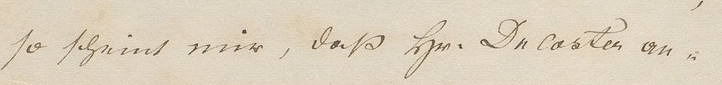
so scheint mir, daß Hr. Du Coster an-
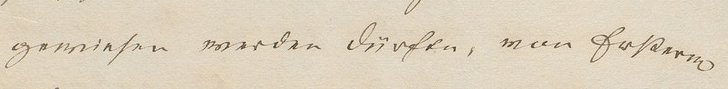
gewiesen werden dürfte, von Ersterm
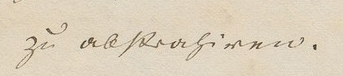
zu abstrahiren. –
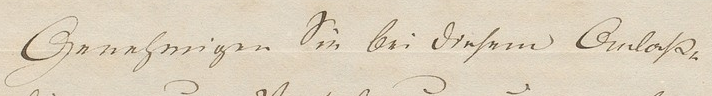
Genehmigen Sie bei diesem Anlaße
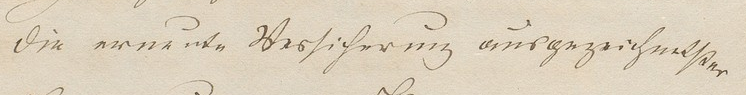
die erneute Versicherung ausgezeichnetster
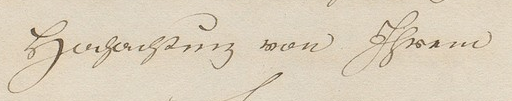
Hochachtung von Ihrem
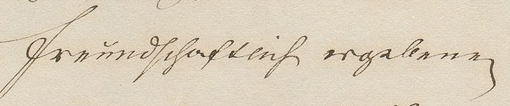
freunschaftlich ergebenen
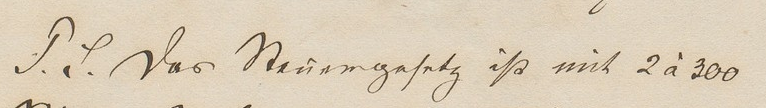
P. S. das Steuergesetz ist mit 2 à 300
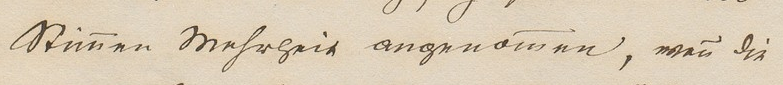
Stimmen Mehrheit angenommen, wenn die
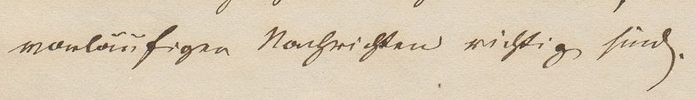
vorläufigen Nachrichten richtig sind.
